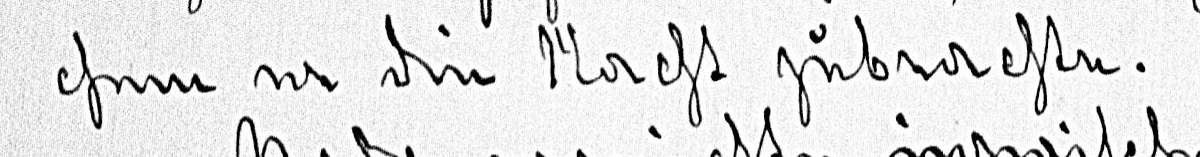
chem er die Nacht zubrachte.
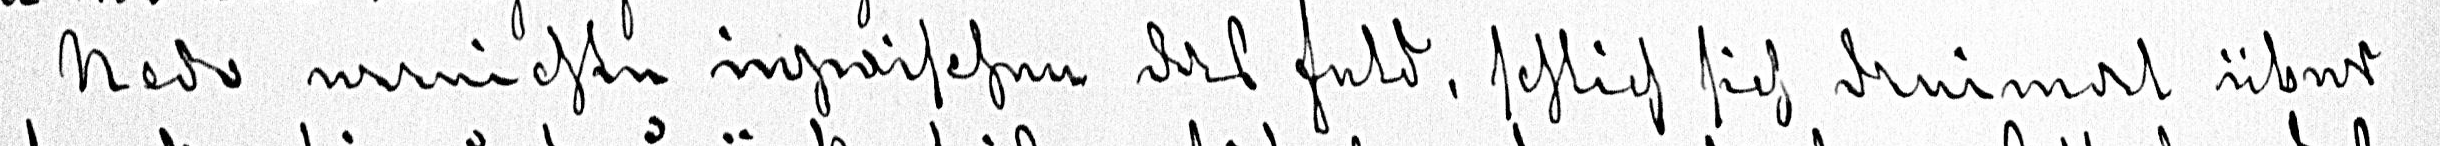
Nedo erreichte inzwischen das Feld, schlich sich dreimal über
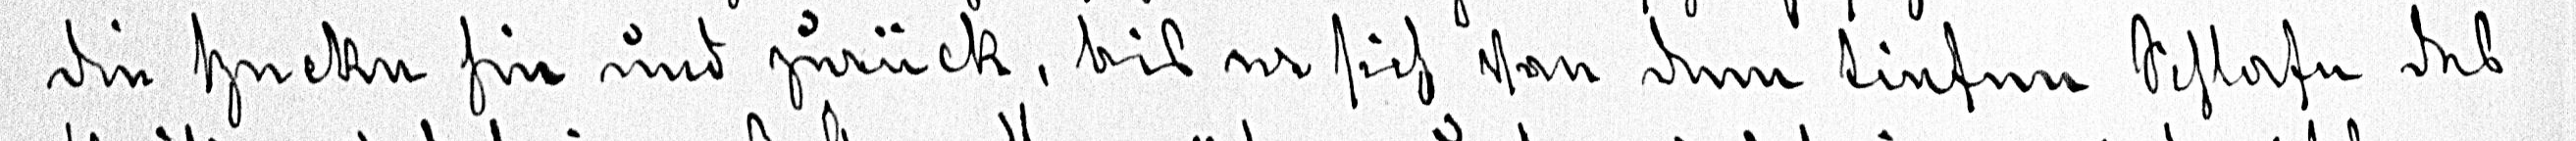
die Hecke sie und zurück, bis er sich von dem tiefen Schlafe des
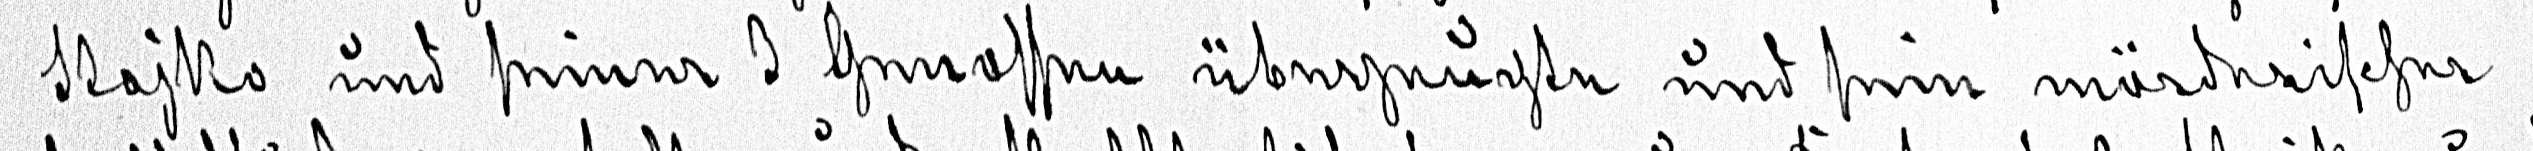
Kojko und seine 3 Genossen überzeugte und sein mörderischer
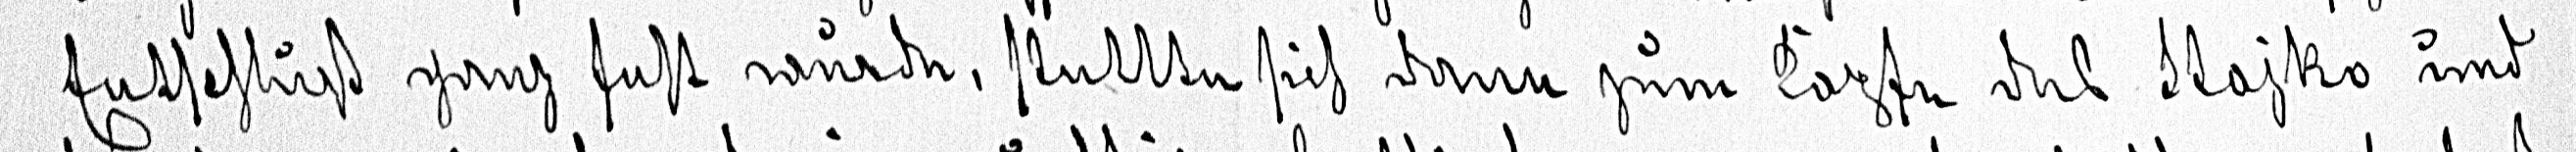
Entschluß ganz fest wurde, stellte sich dann zum Kopfe das Kojko und
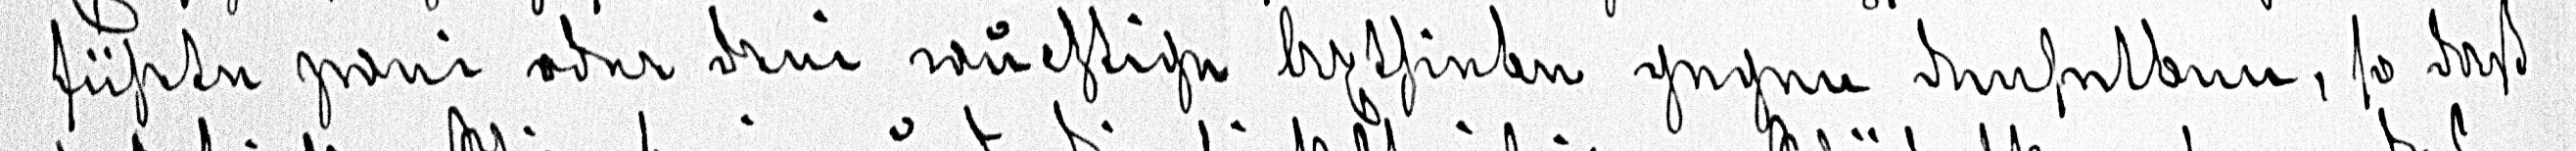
führte zwei oder drei wuchtige Axthiebe gegen denselben, so daß
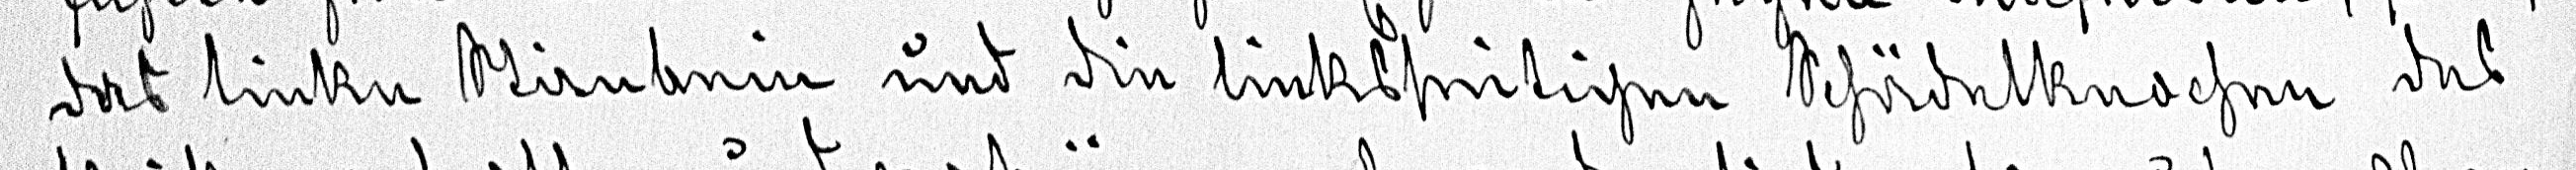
das linke Stirnbein und die linksseitigen Schädelknochen des
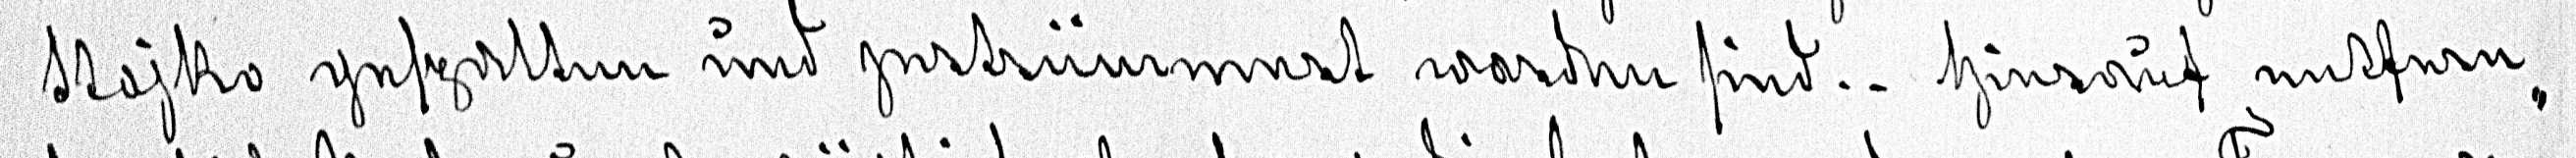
Kojko gespalten und zertrümmert worden sind.. - Hierauf entfern¬
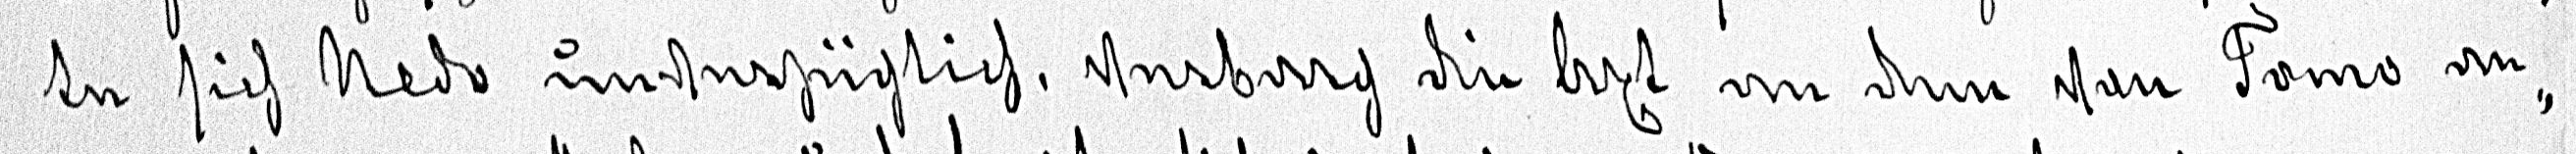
te sich Nedo unverzüglich, verberg die Axt an dem von Tomo an¬
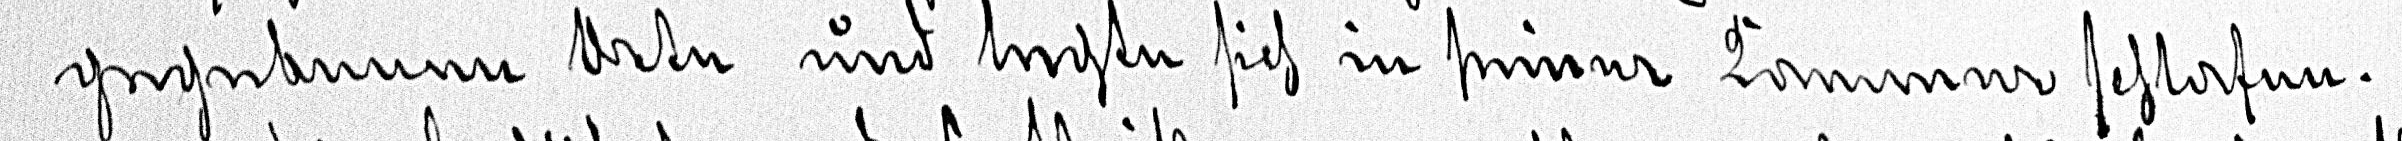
gegebenen Orte und legte sich in seiner Kommen schlafen.
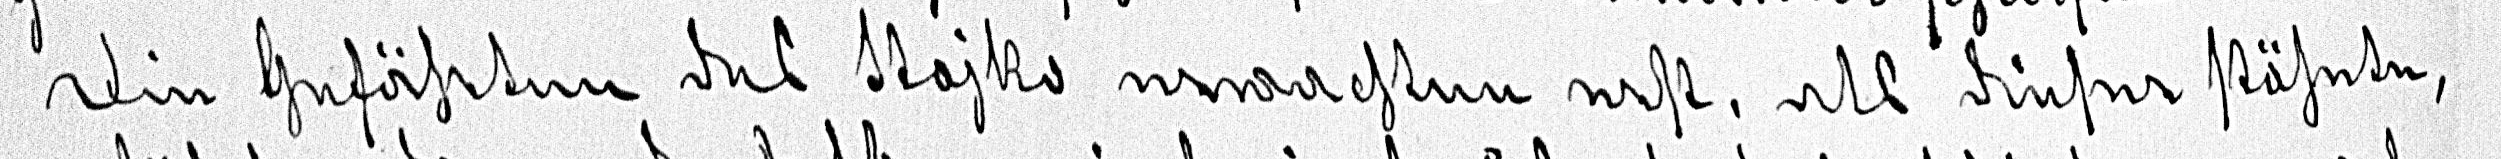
Die Gefährten des Kojko erwachten erst, als dieser stöhnte,
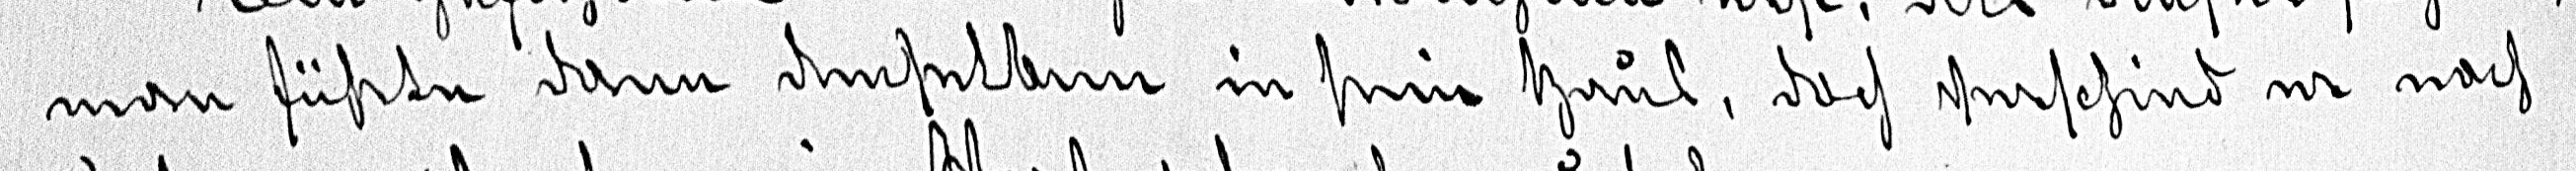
man führte dann denselben in sein Haus, doch verschied er noch
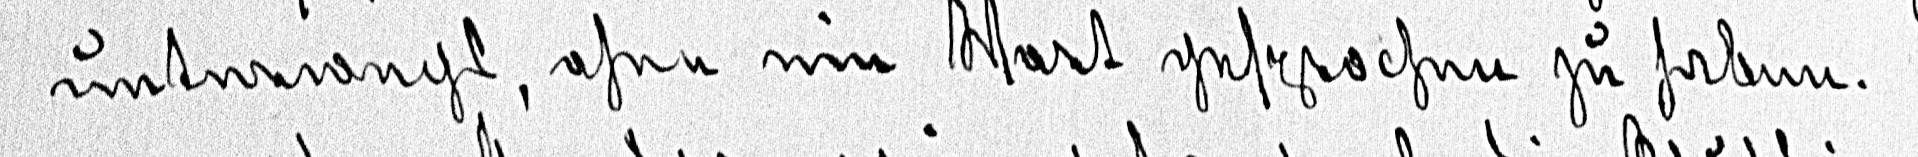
unterwacht, ohne ein Wart gesprochen zu haben.
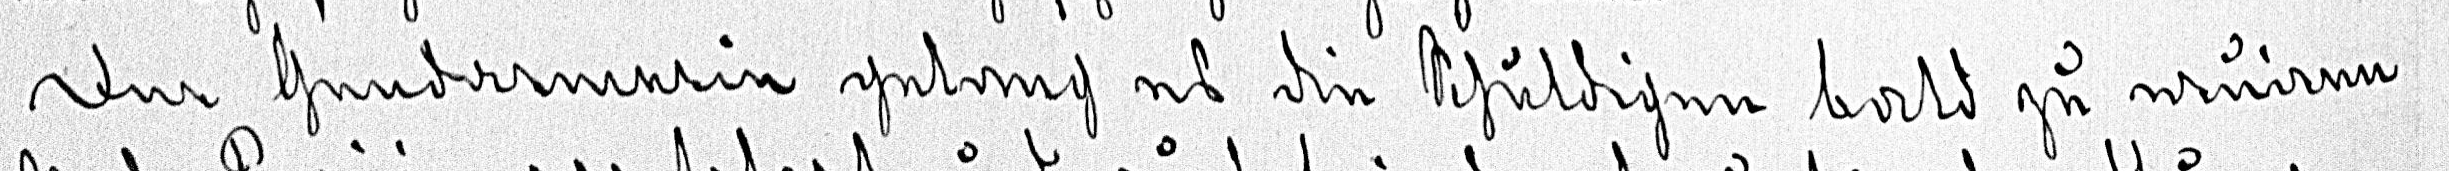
Der Gendarmerie gelang es die Schuldigen bald zu eruiren
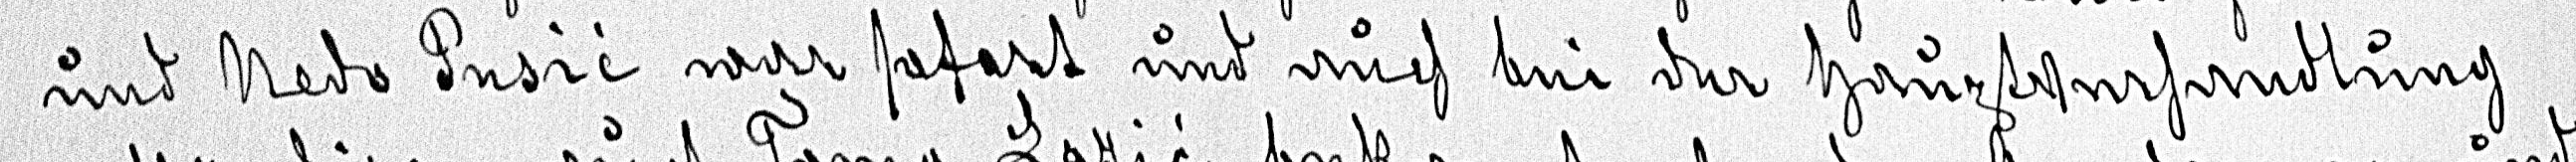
und Nedo Pusić war sofert und auch bei der Hauptverhandlung
